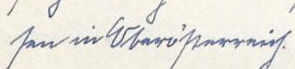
sen in Oberösterreich.
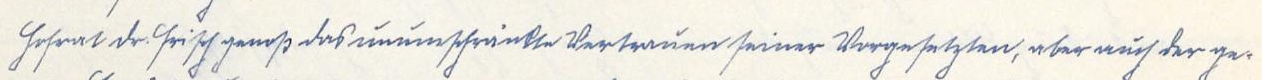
Hofrat Dr. Frisch genoß das uneingeschränkte Vertrauen seiner Vorgesetzten, aber auch der ge-
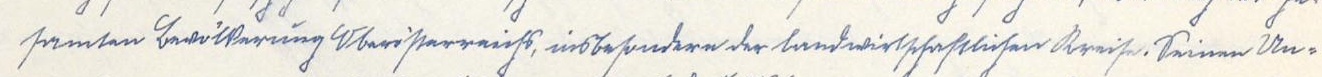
samten Bevölkerung Oberösterreichs, insbesondere der landwirtschaftlichen Kreise. Seinen Un-
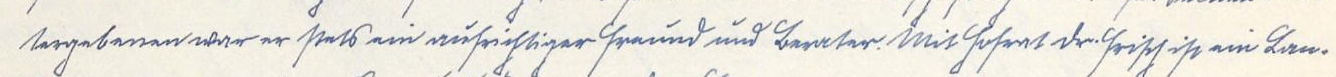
tergebenen war er stets ein aufrichtiger Freund und Berater. Mit Hofrat Dr. Frisch ist ein Land-
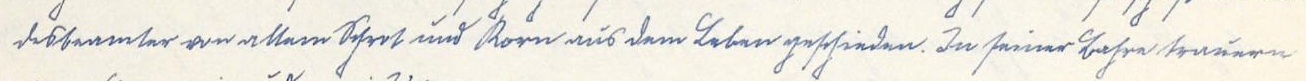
desbeamter von altem Schrot und Korn aus dem Leben geschieden. In seiner Bahre trauern
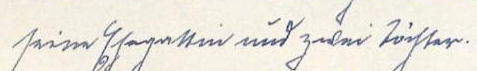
seine Ehegattin und zwei Töchter.
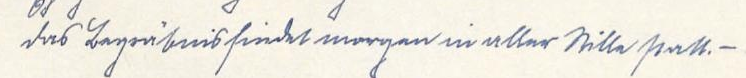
Das Begräbnis findet morgen in aller Stille statt.-
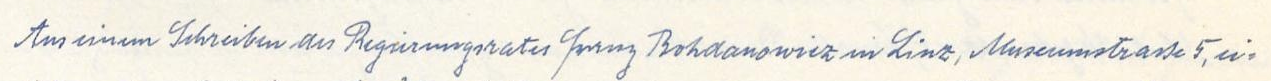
Aus einem Schreiben des Regierungsrates Franz Bohdanowicz in Linz, Museumsstraße 5, ei-
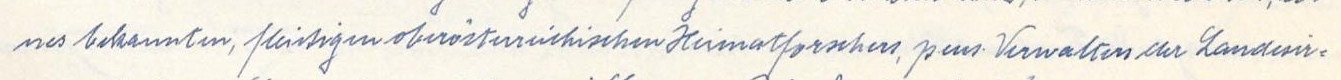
bekannten, fleißigen oberösterreichischen Heimatforschers, pen. Verwalter der Landesir-
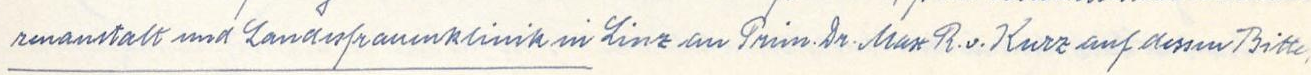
renanstalt und Landesfrauenklinik in Linz an Prim. Dr. Max R. von Kurz auf dessen Bitte,
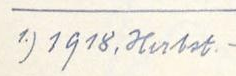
1) 1918, Herbst.-
